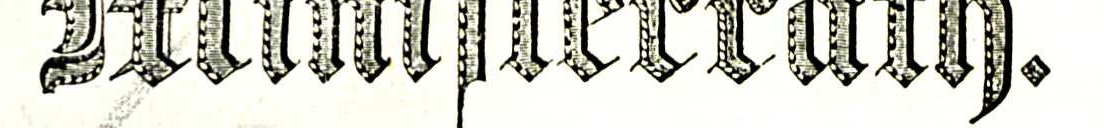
Ministerrath
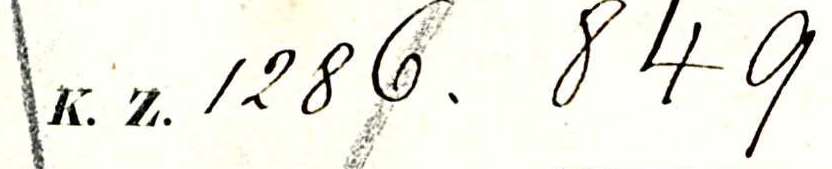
KZ 1286 849
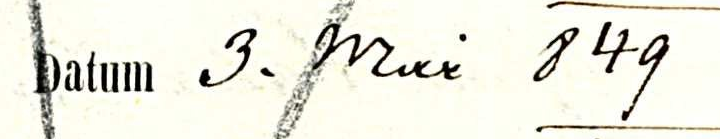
Datum 3. Mai 1849
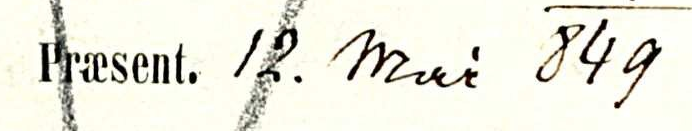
Praesent 12. Mai 849
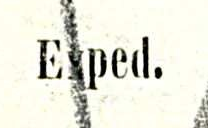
Exped.
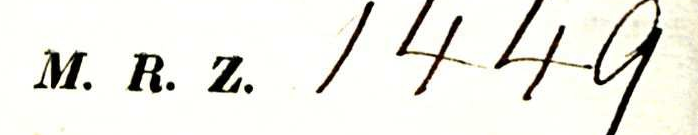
MRZ 1449
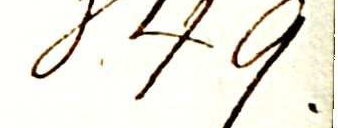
849
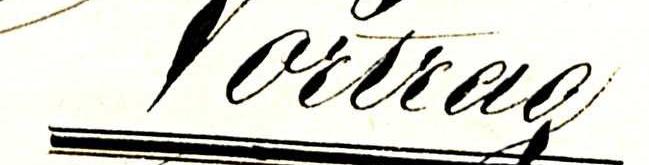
Vortrag
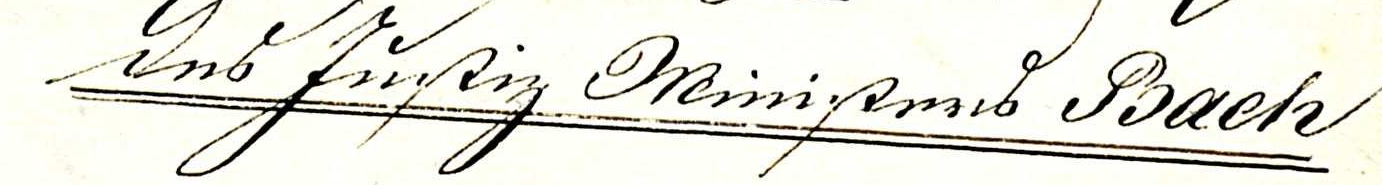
des Justiz-Ministers Bach
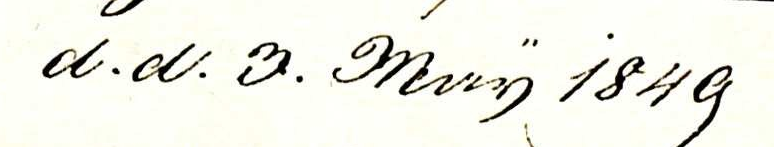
dd. 3. May 1849
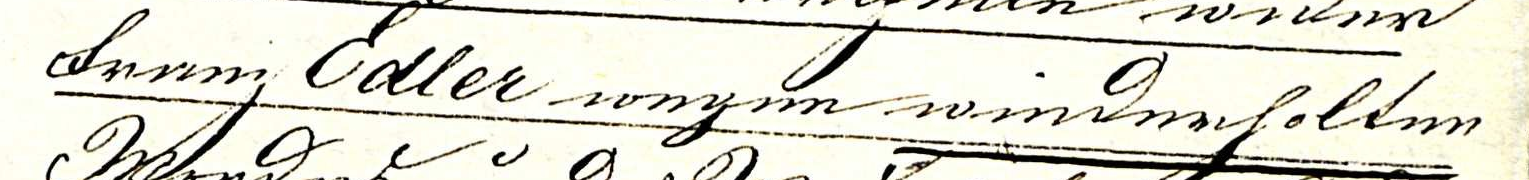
Franz Edler wegen wiederholten
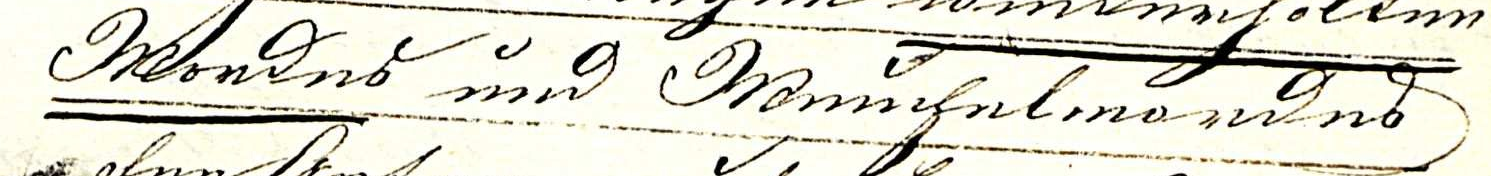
Mordes und Meuchelmordes
